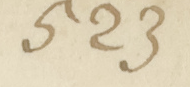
523
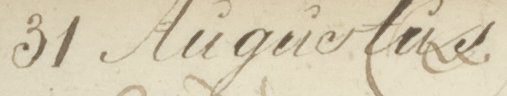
31Augustus
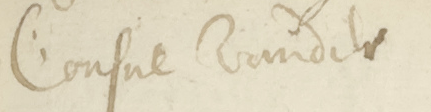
Consul vander
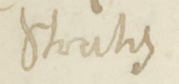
Straten
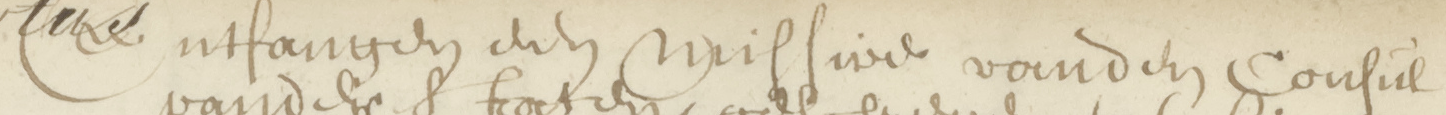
Ontfangen een missive vanden Consul
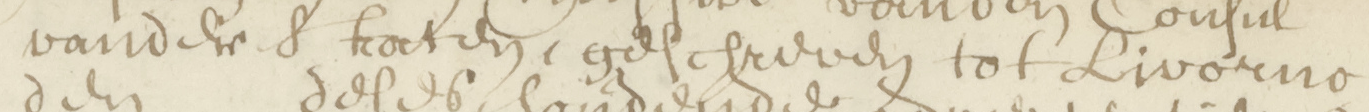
vander Staten, geschreven tot Livorno
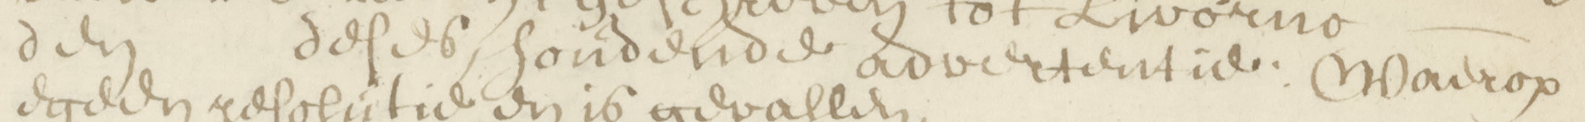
den deses, houdende advertentie: Waerop
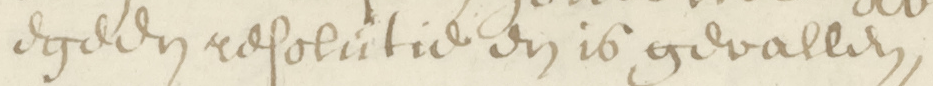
egeen resolutie en is gevallen.
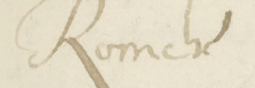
Romer
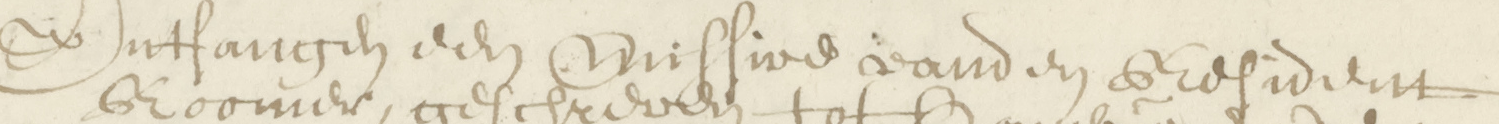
Ontfangen een Missive vanden Resident
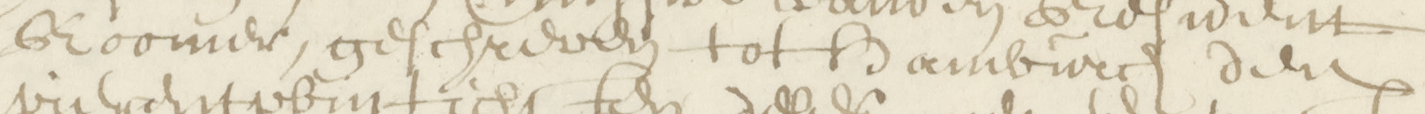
Roomer, geschreven tot Hamburch den
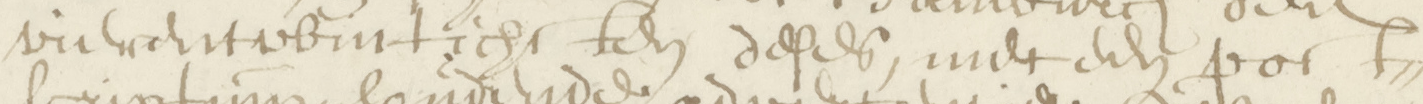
vierentwintichsten deses, met een post„
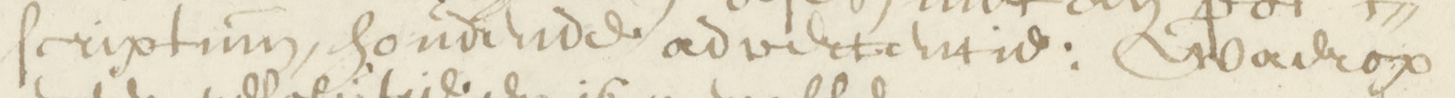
scriptum, houdende advertentie: Waerop
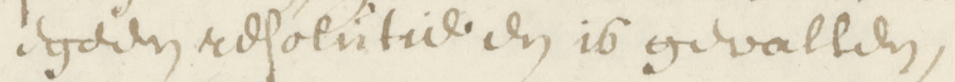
egeen resolutie en is gevallen.
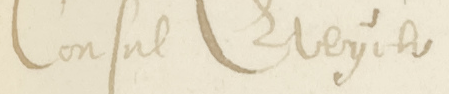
Consul Ewijck
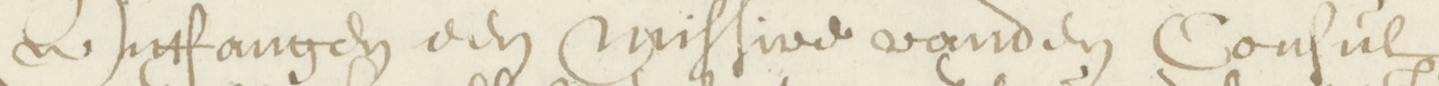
Ontfangen een Missive vanden Consul
